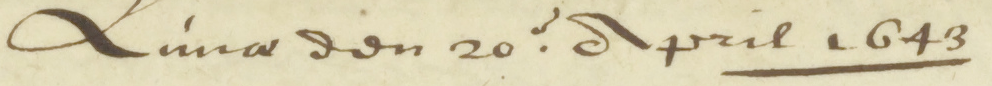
Luna den 20e April 1643
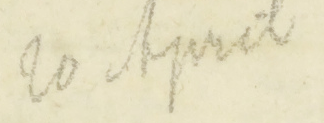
20 April.
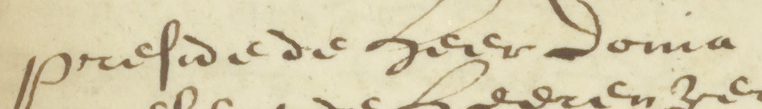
Preside de Heer Donia,
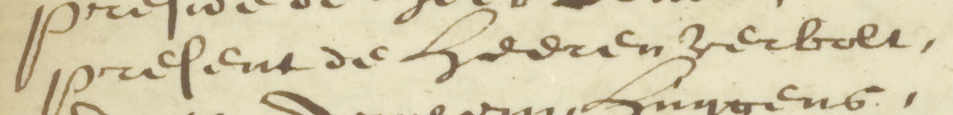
Present de Heeren Verbolt,
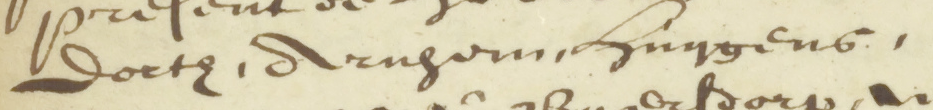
Dorth, Arnhem, Huygens,
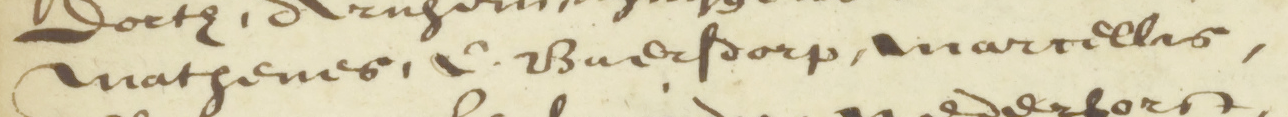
Matheues, vn Baersdorp, Marcellis,
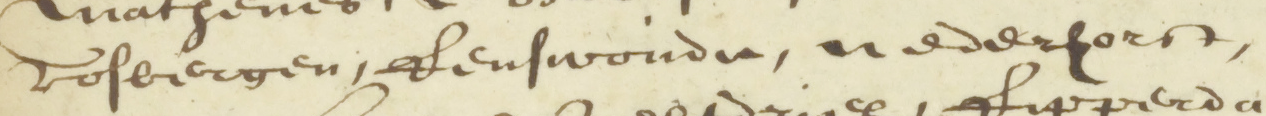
Vosbergen, Renswoude, Nederhorst,
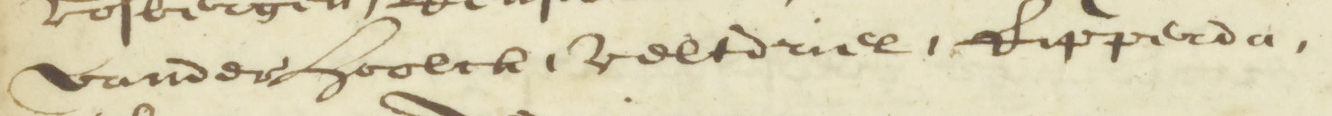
vander Hoolck, Veltdriel, Ripperda,
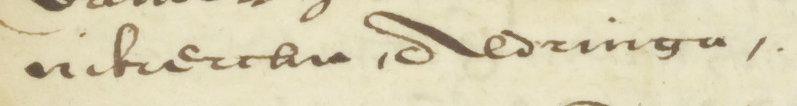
Nikercke, Aldringa.
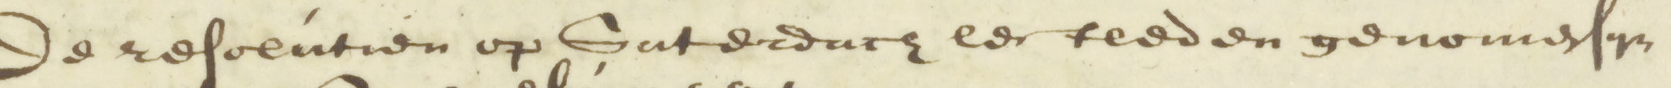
De resolutien op Saterdach lestleden genomen syn
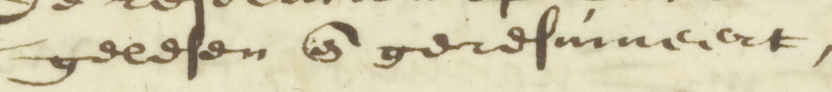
gelesen en geresumeert,
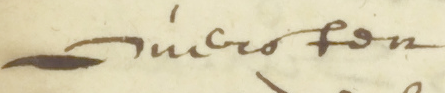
Oversten
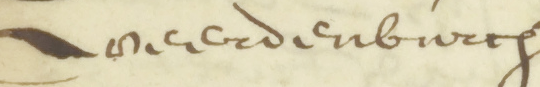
Weerdenburch
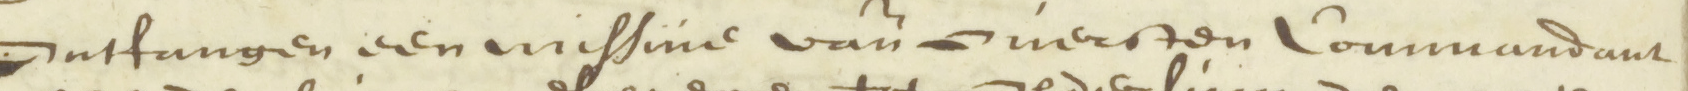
Ontfangen een missive van Oversten Commandant
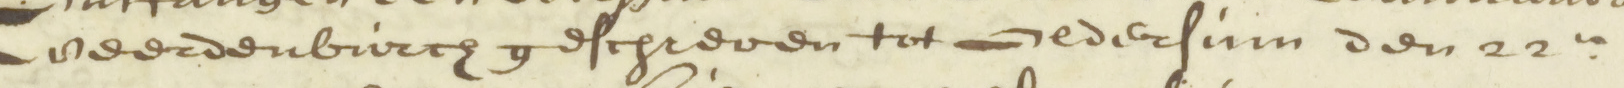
Weerdenburch geschreven tot Oldersum den 22e
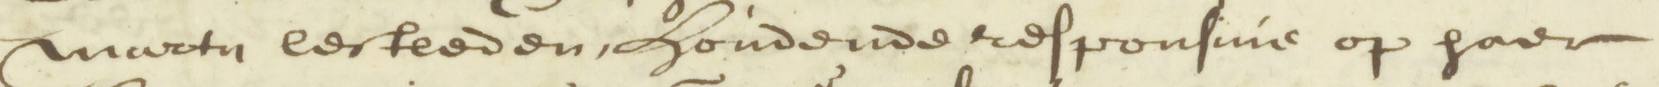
marty lestleden, houdende responsive op haer
